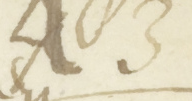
483
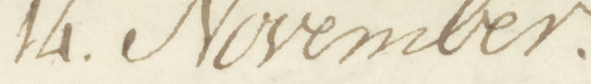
14. November.
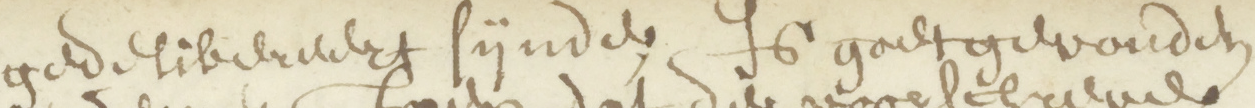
gedelibereert sijnde, Is goetgevonden
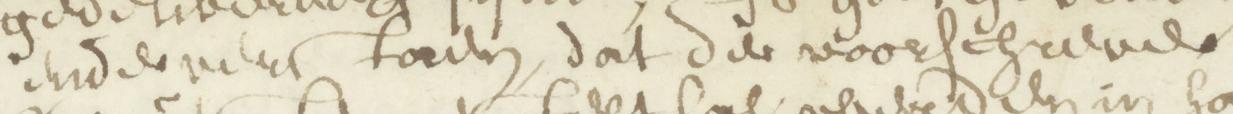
ende verstaen, dat de voorschreve
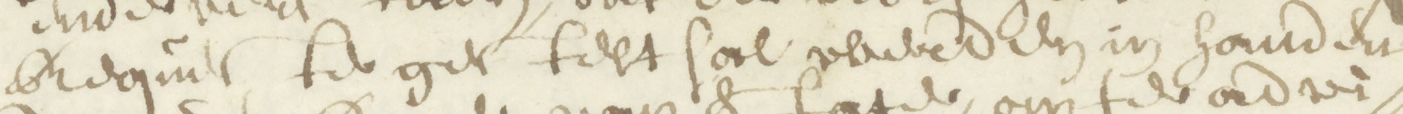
Requeste gestelt sal werden in handen
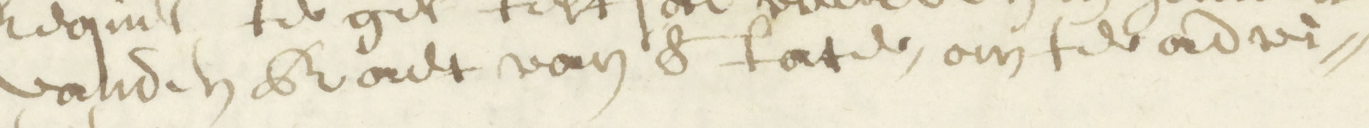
vanden Raet van State, om te advi„
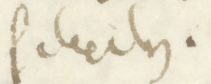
seren.
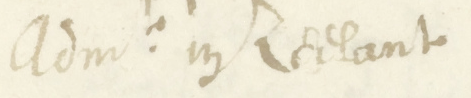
Admt. in Zeelant
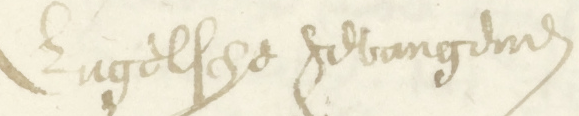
Engelsche gevangenen
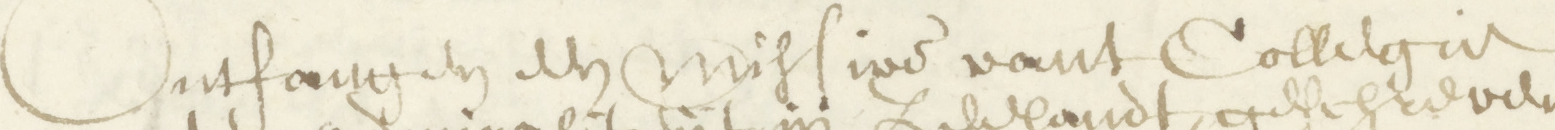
Ontfangen een Missive vant Collegie
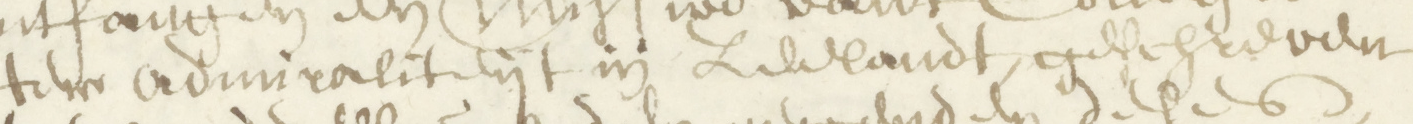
ter Admiraliteijt in Zeelandt, geschreven
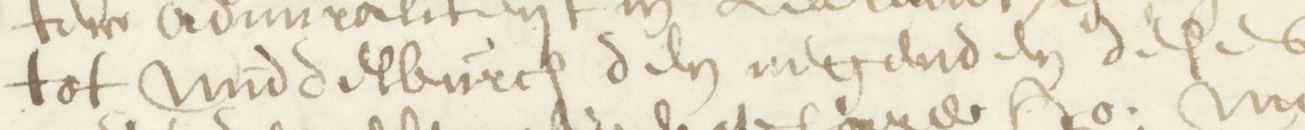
tot Middelburch den negenden deses,
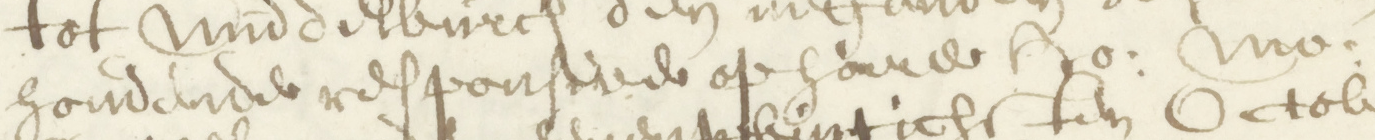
houdende responsive op hare Ho:Mo:
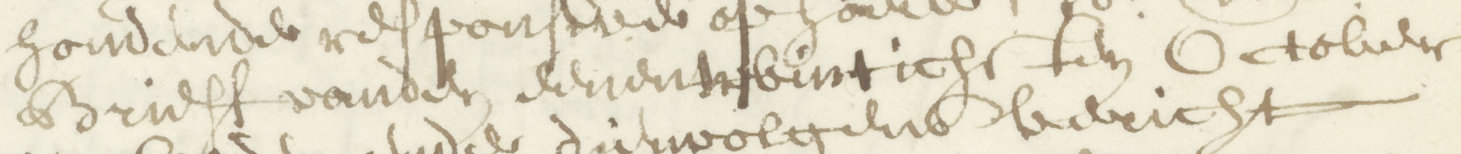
Brieff vanden eenentwintichsten October
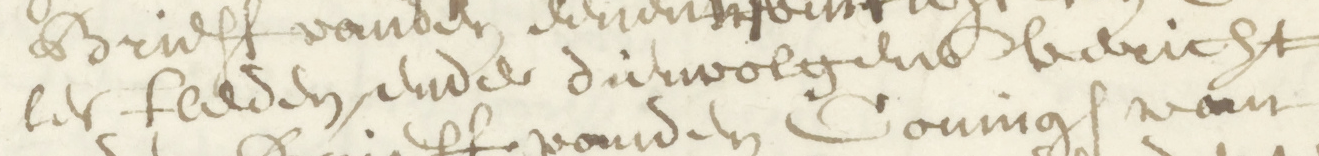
lestleden, ende dienvolgens bericht
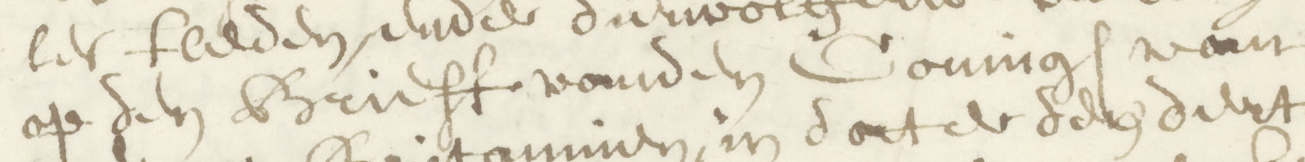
op den Brieff vanden Coningh van
